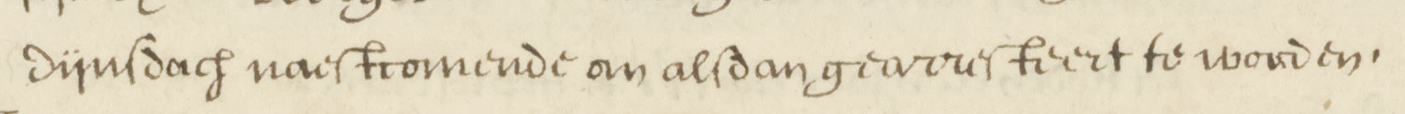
Dijnsdach naestcomende om alsdan gearresteert te worden.
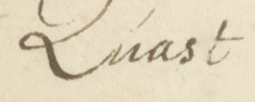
Quast
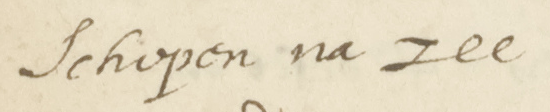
Schepen na zee
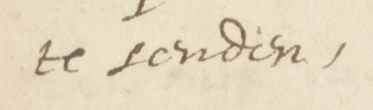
te senden.
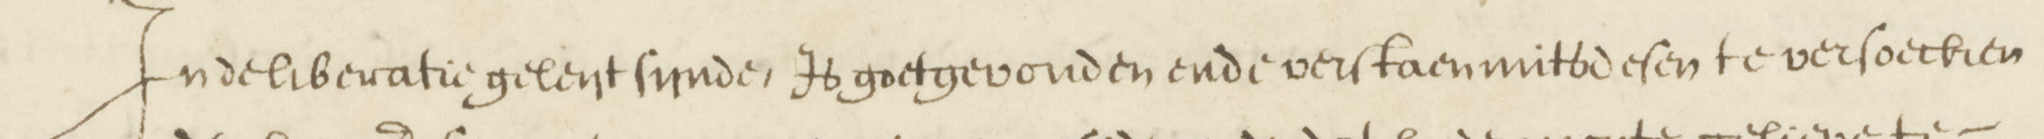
In deliberatie geleyt synde, Is goetgevonden ende verstaen mitsdesen te versoecken
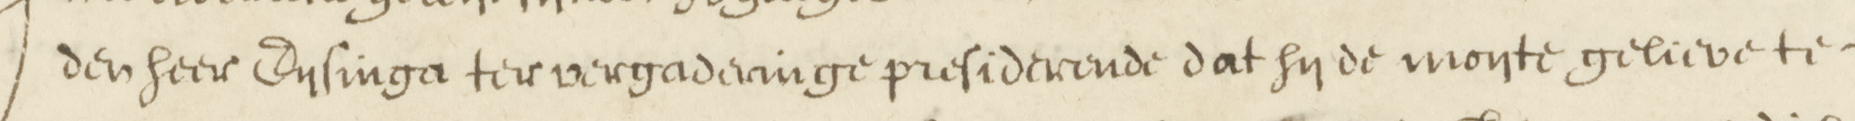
den heer Eysinga ter vergaderinge presiderende dat hy de moyte gelieve te
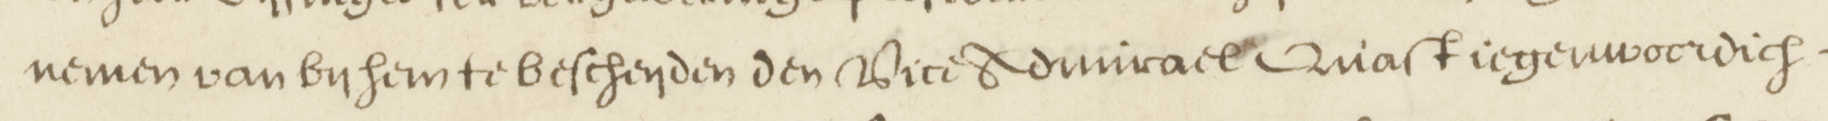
nemen van by hem te bescheyden den Vice Admirael Quast iegenwoordich
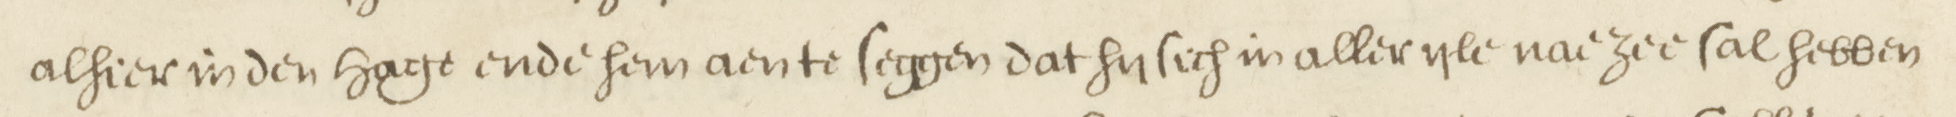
alhier in den hage ende hem aen te seggen dat hy sich in alleryle nae zee sal hebben
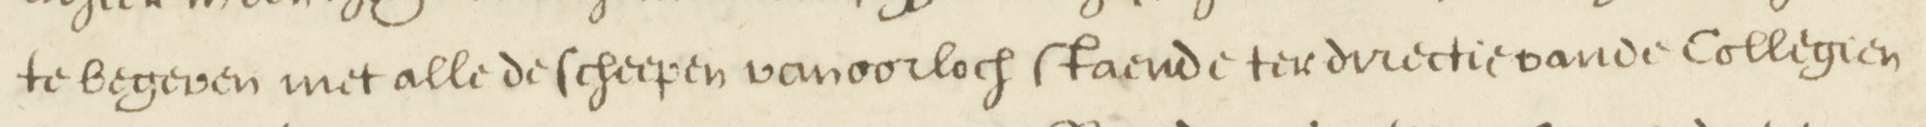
te begeven met alle de scheepen van oorloch staende ter directie vande Collegien
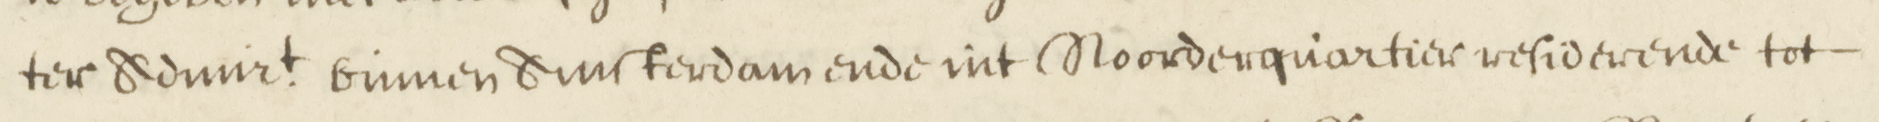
ter Admirt. binnen Amsterdam ende int Noorderquartier residerende tot
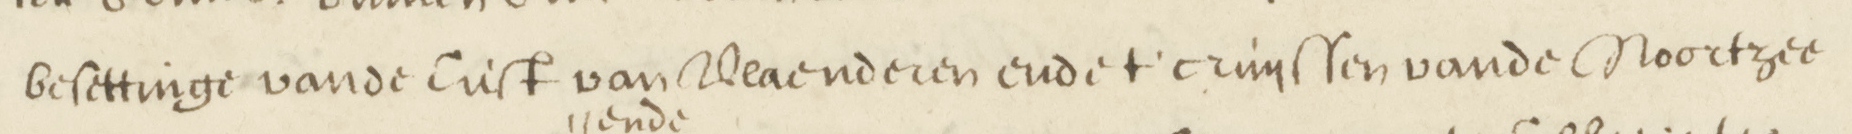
besettinge vande Cust van Vlaenderen ende t'cruyssen vande Noortzee
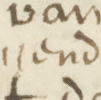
,, ende
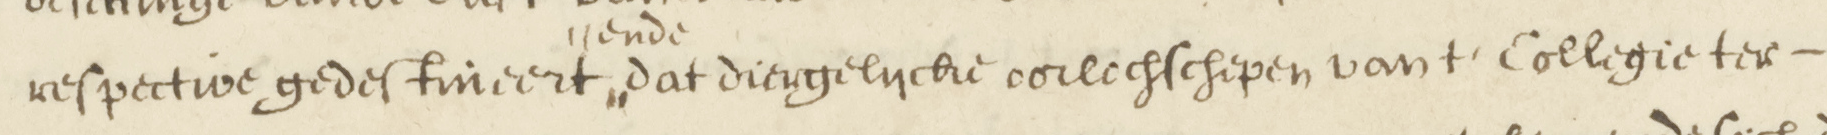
respective gedestineert,, dat diergelycke oorlochschepen van t'Collegie ter-
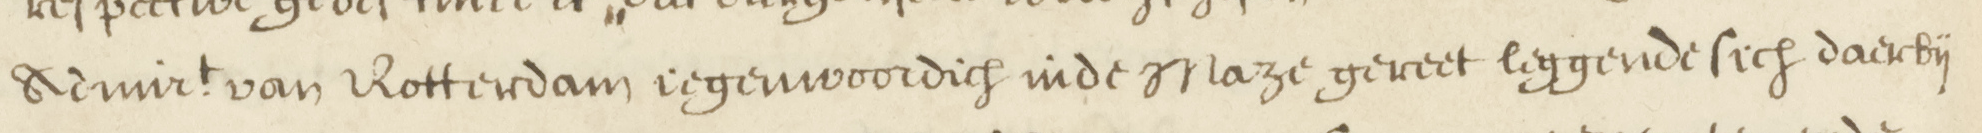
Admirt. van Rotterdam iegenwoordich inde Maze gereet leggende sich daerbij
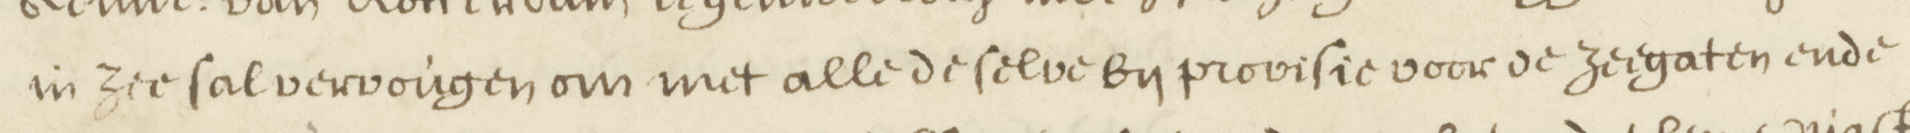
in zee sal vervougen om met alle deselve by provisie voor de zeegaten ende
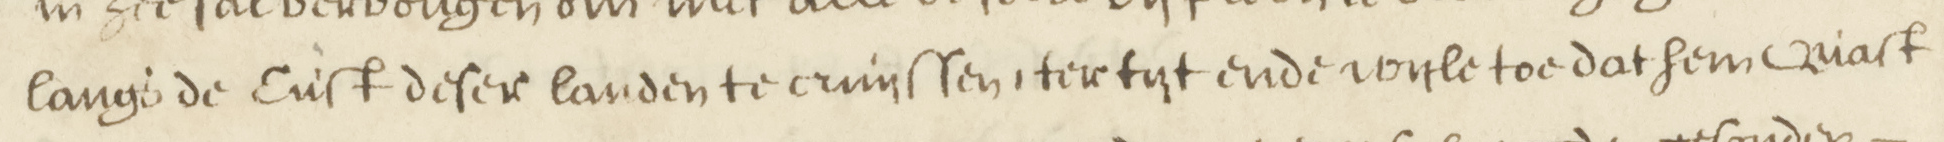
langs de Cust deser landen te cruyssen, ter tyt ende wyle toe dat hem Quast
